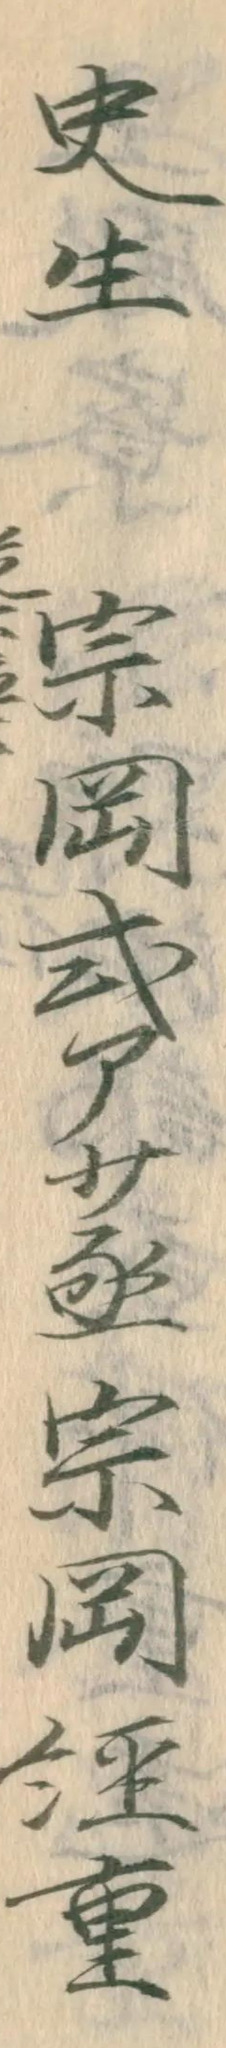史生宗岡式部少丞宗岡経重
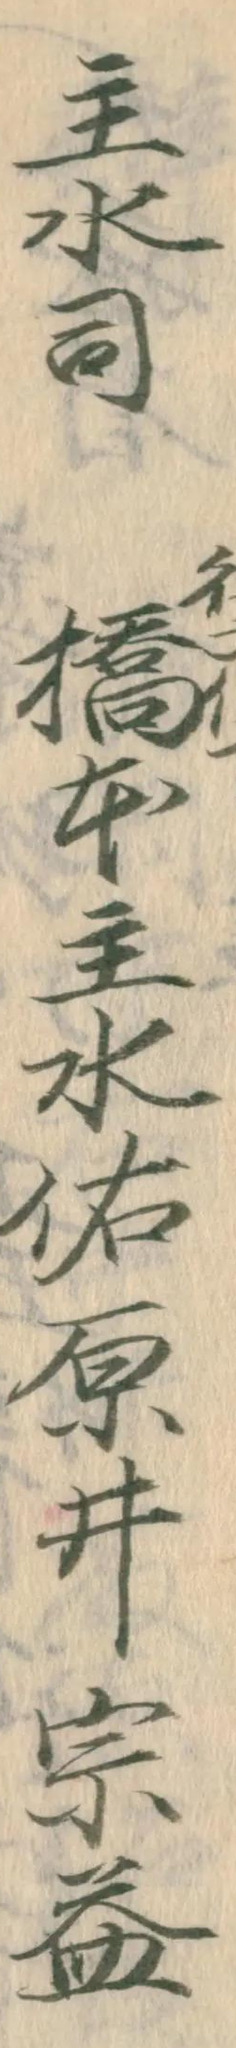主水司橋本主水佑原井宗益
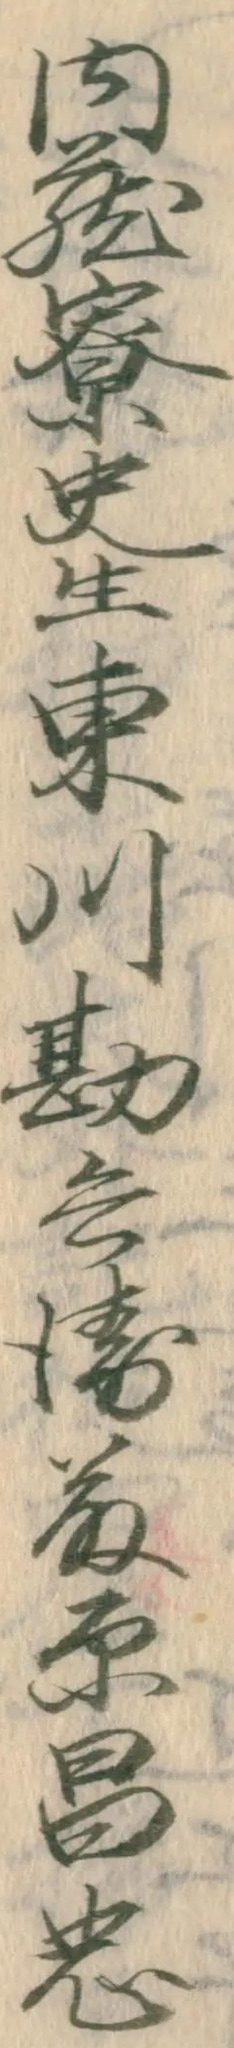内蔵寮史生東川勘兵衛藤原昌忠
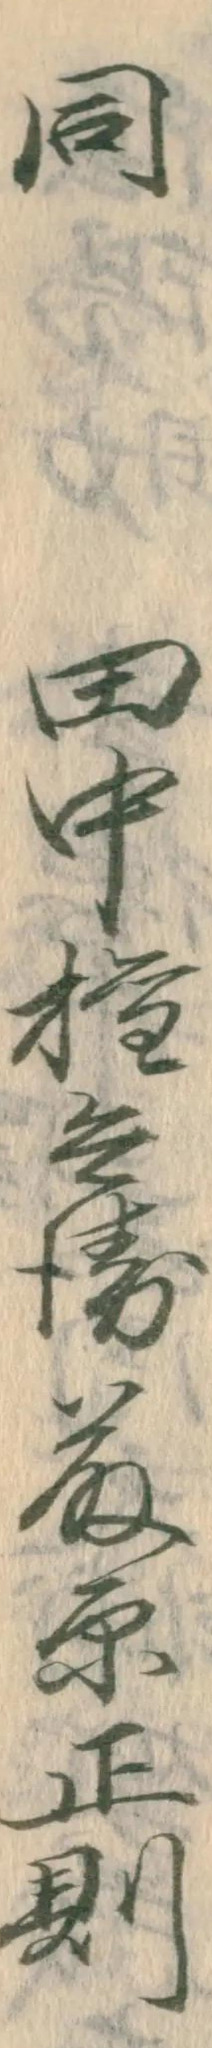同田中権兵衛藤原正則
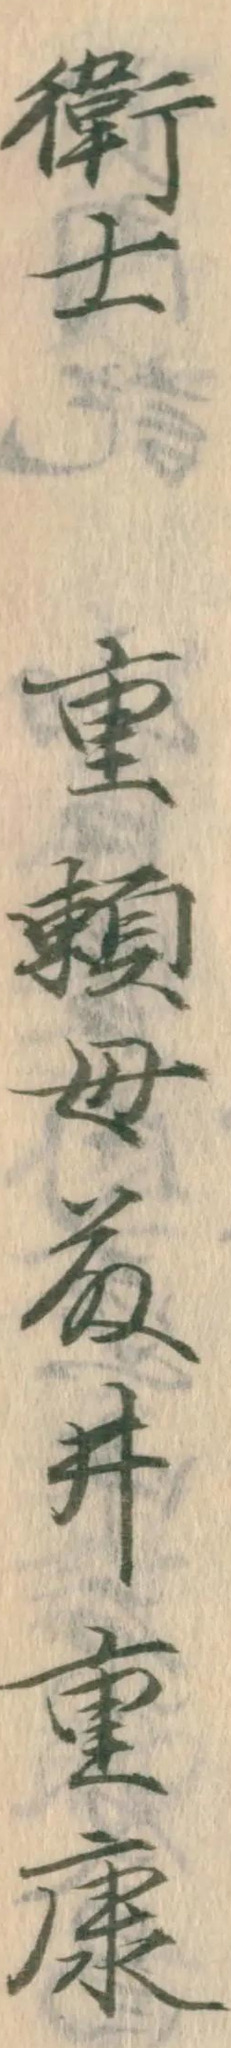衛士重頼母藤井重康
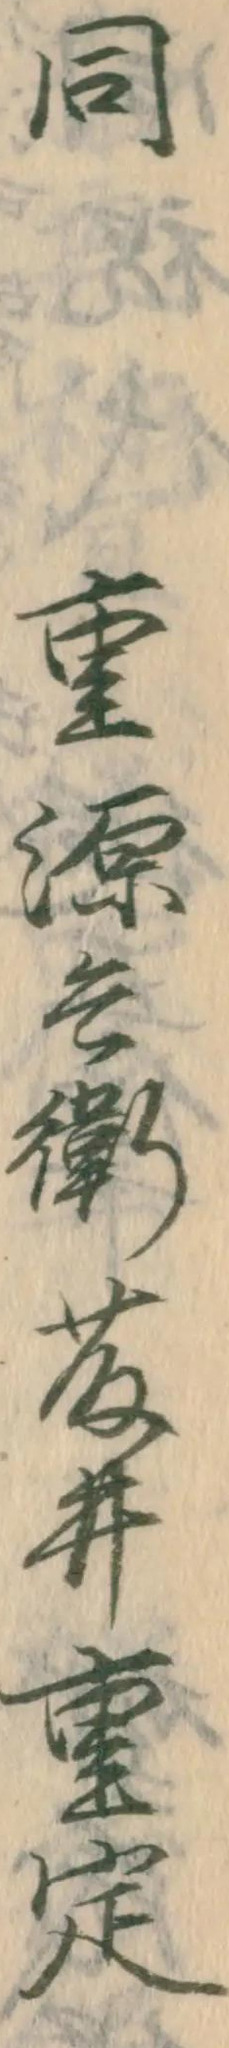同重源兵衛藤井重定
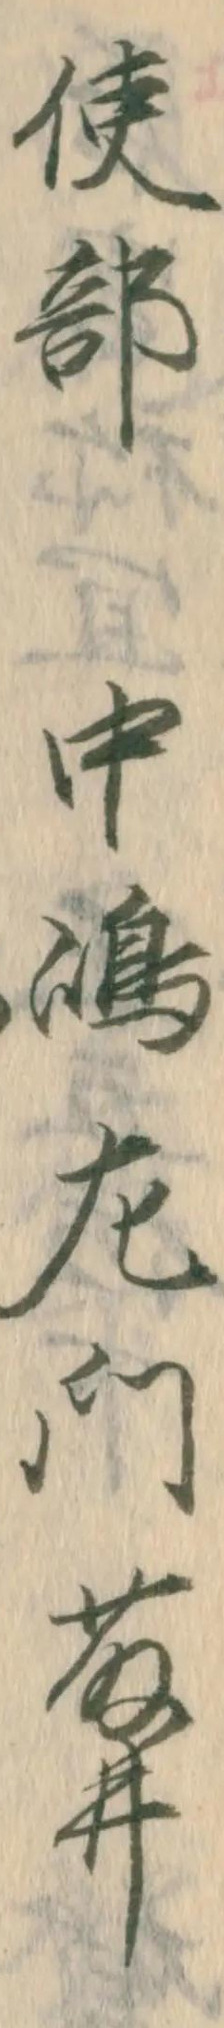使部中嶋左門藤井
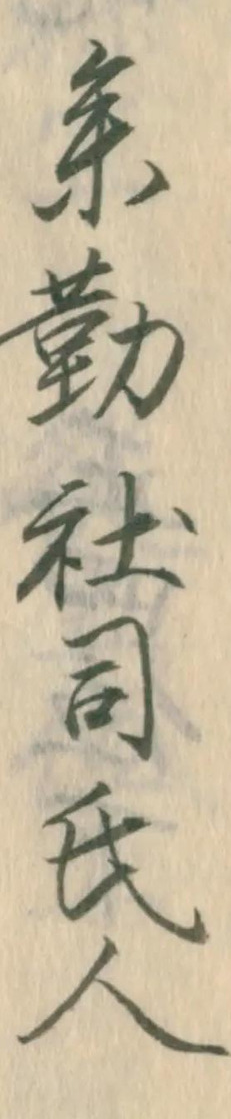参勤社司氏人
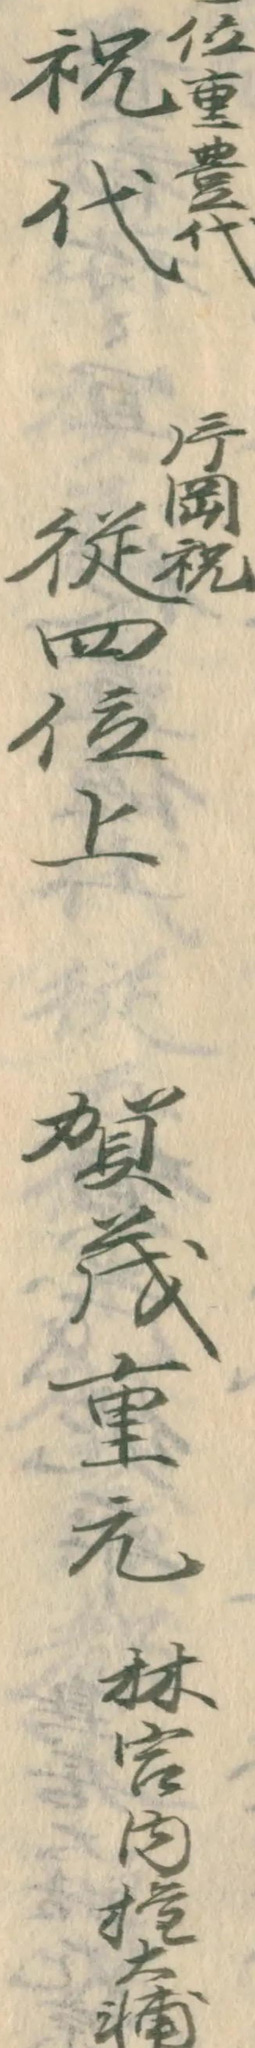祝代従四位上賀茂重元林宮内権大輔
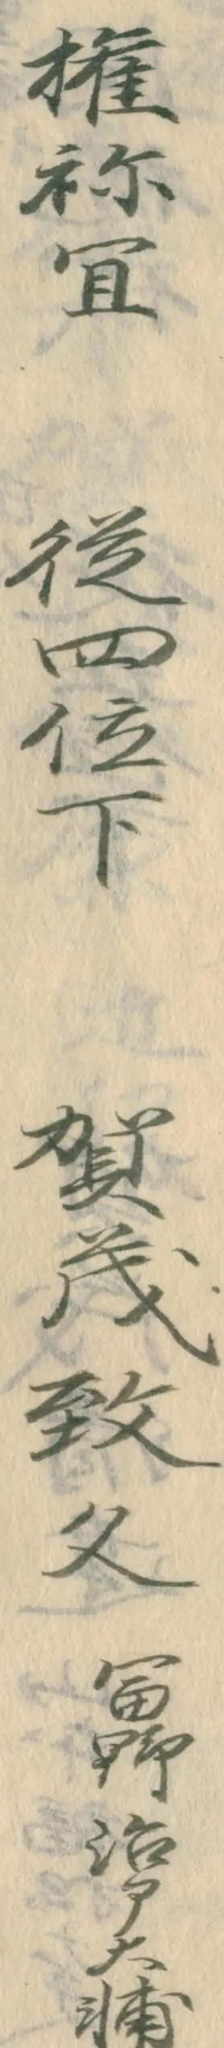権祢宜従四位下賀茂致久富野治部大輔

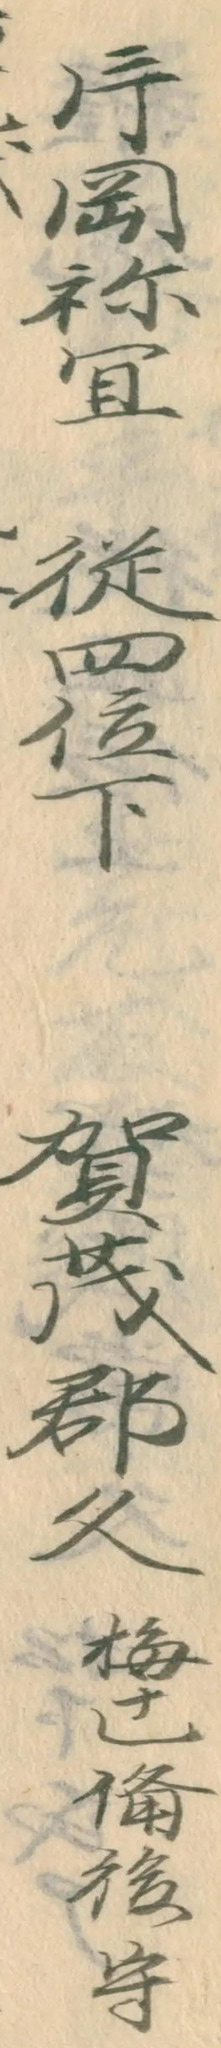片岡祢宜従四位下賀茂郡久梅辻備後守
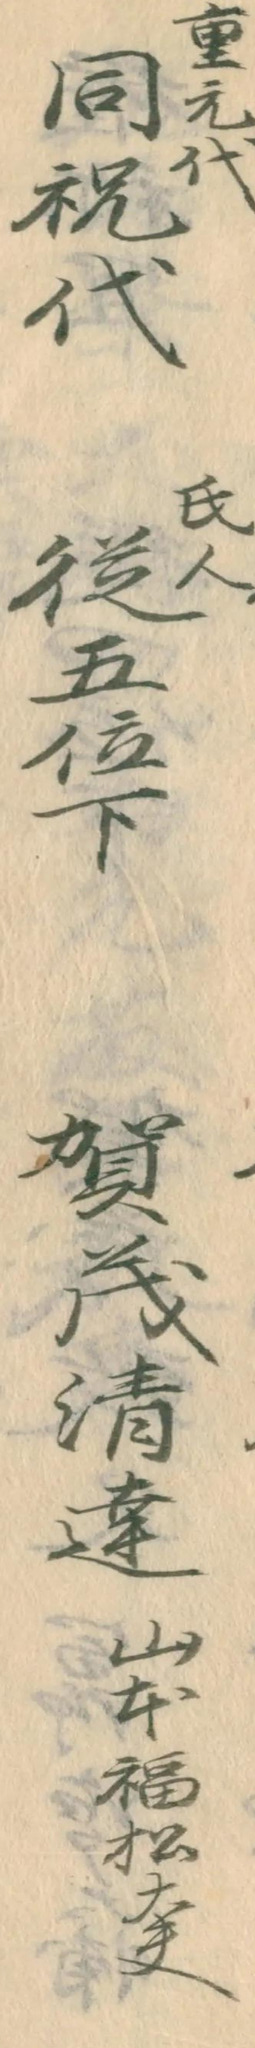同祝代従五位下賀茂清達山本福松大夫
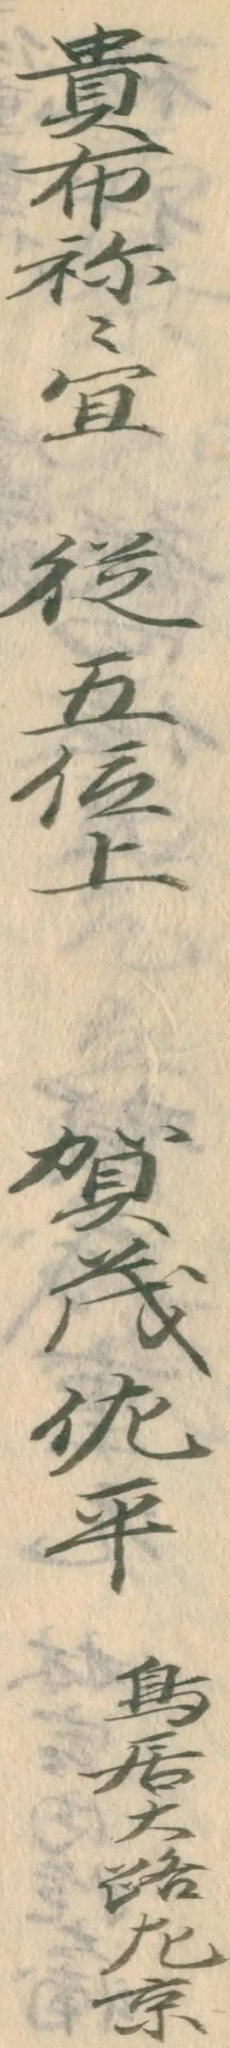貴布祢々冝従五位上賀茂佐平鳥居大路左京
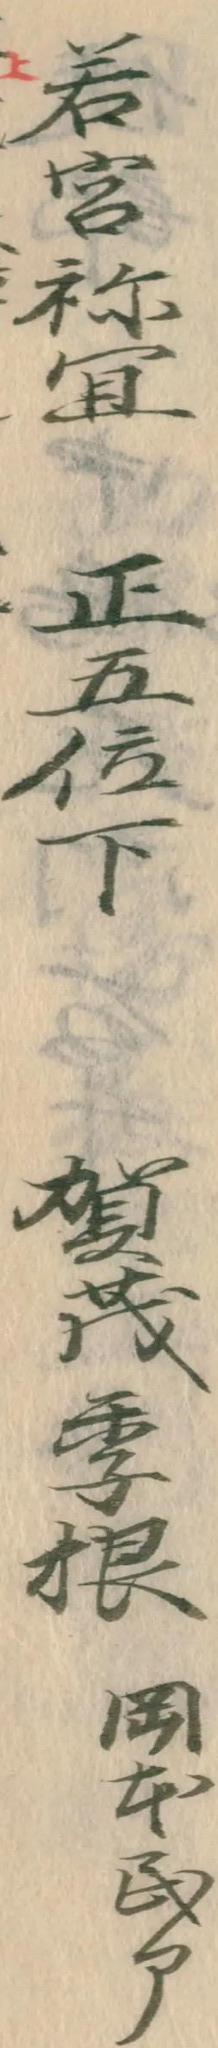若宮祢宜正五位下賀茂季根岡本民部
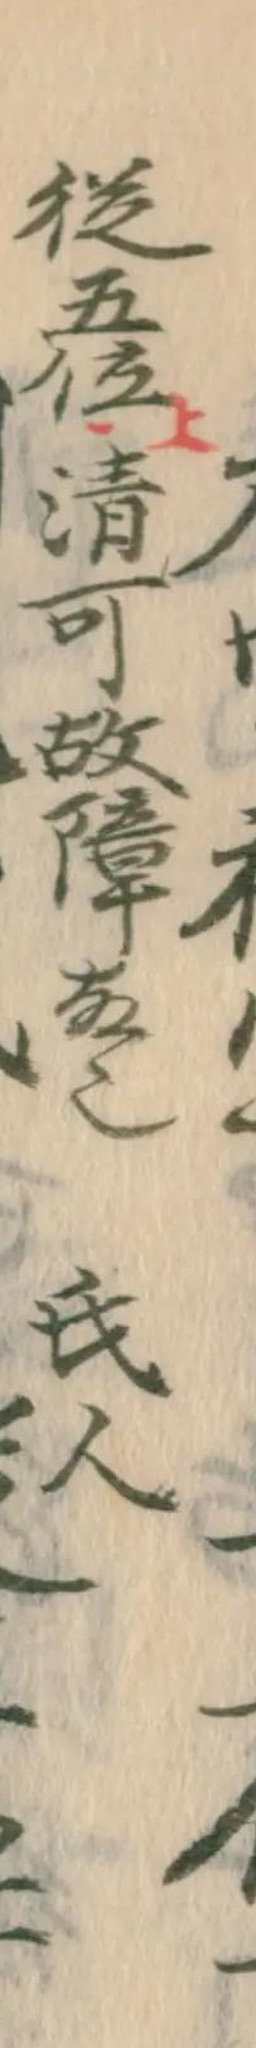従五位￮清可故障故也氏人
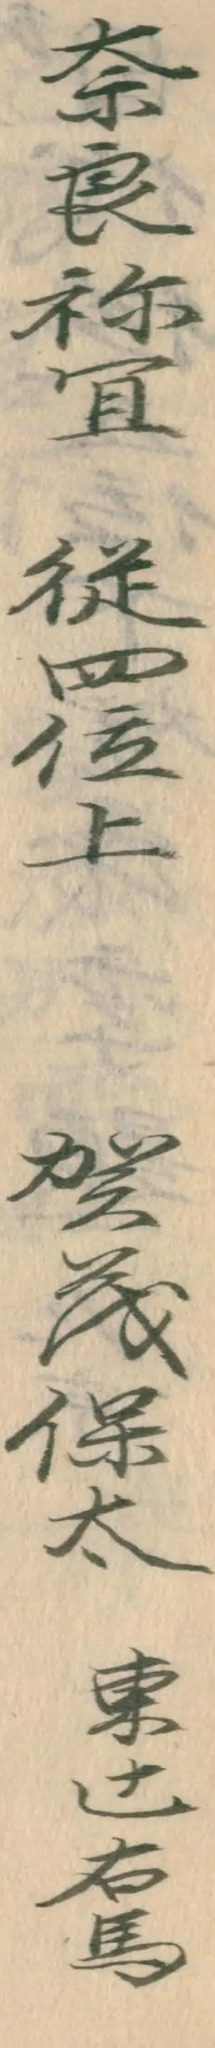奈良祢宜従四位上賀茂保太東辻右馬
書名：賀茂社記録. 第16冊
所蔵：国立国会図書館 National Diet Library, JAPAN
